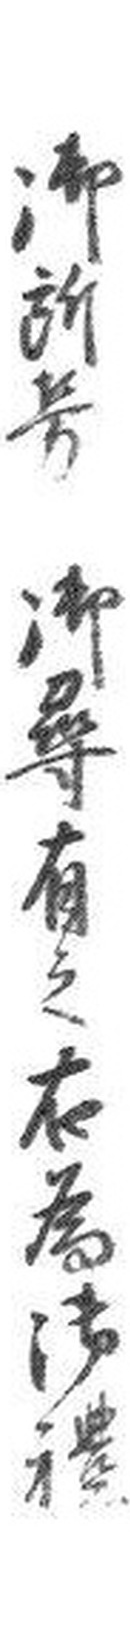御所労御尋有之右為御礼
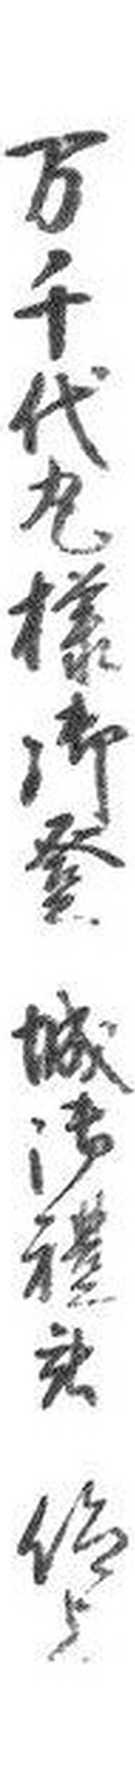万千代丸様御登城御礼被仰上
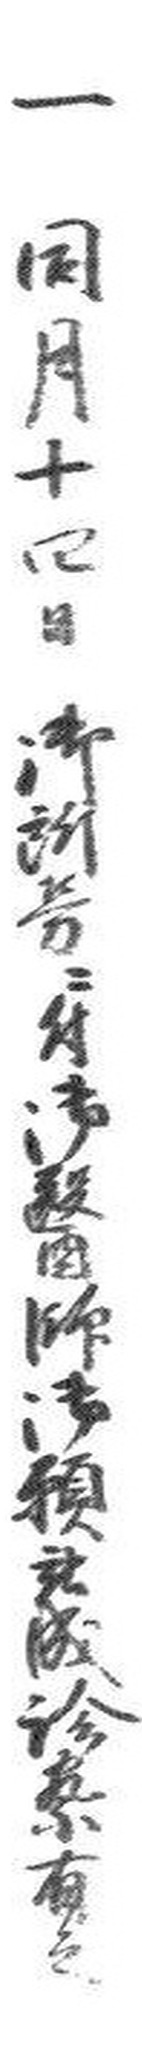一同月十四日御所労ニ付御医師御願被成診察有之
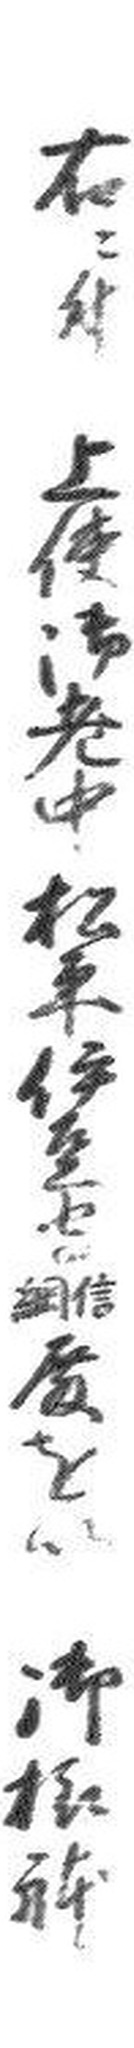右ニ付上使御老中松平伊豆守信綱を以御様体
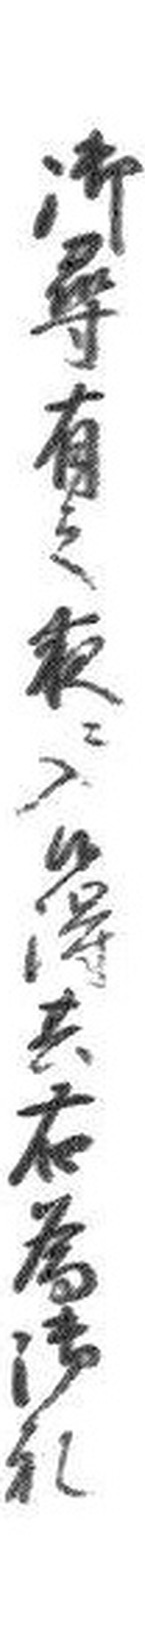御尋有之夜ニ入候得共右為御礼
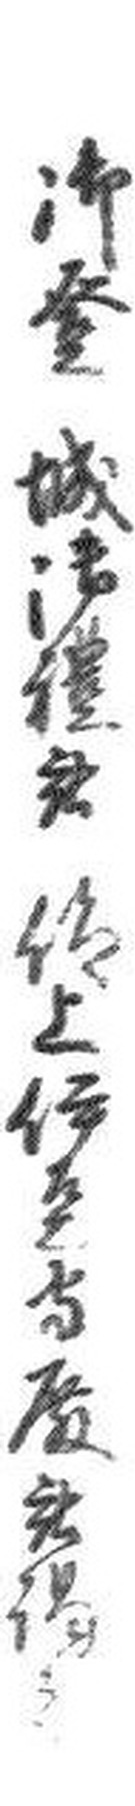御登城御礼被仰上伊豆守殿被謁之
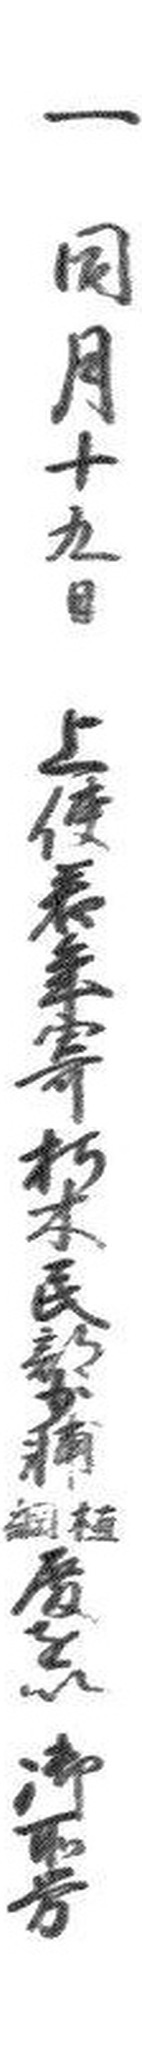一同月十九日上使若年寄朽木民部少輔稙綱殿を以御所労
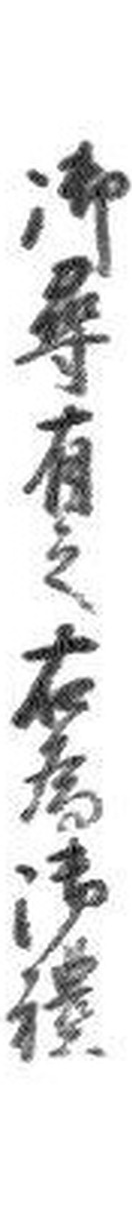御尋有之右為御礼
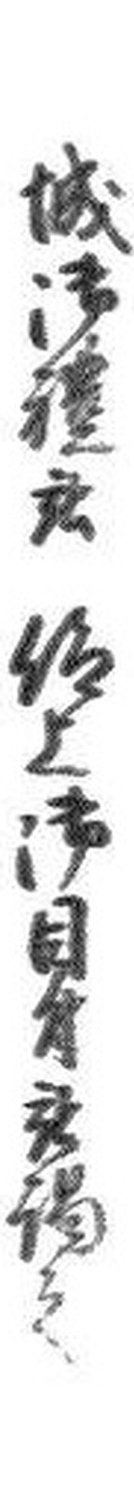城御礼被仰上御目付被謁之
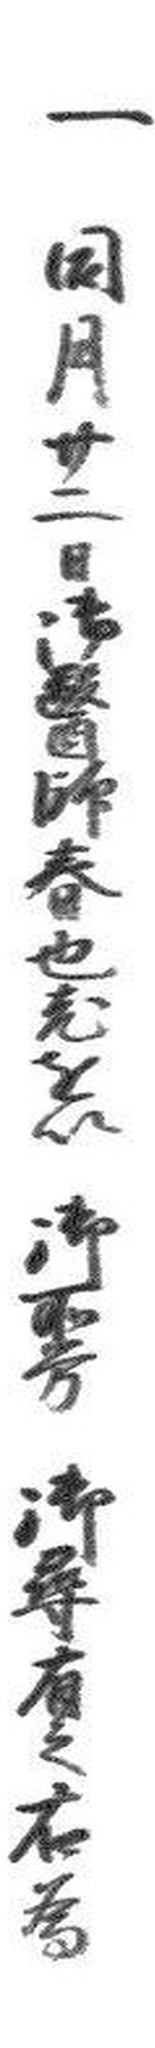一同月廿二日御医師春也老を以御所労御尋有之右為

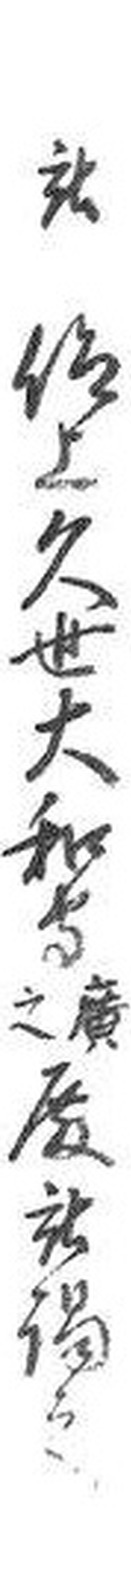被仰上久世大和守広之殿謁之
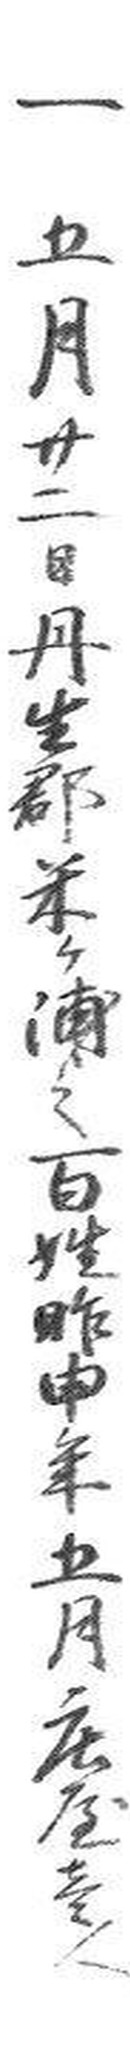一五月廿二日丹生郡米ヶ浦之百姓昨申年五月庄屋壱人
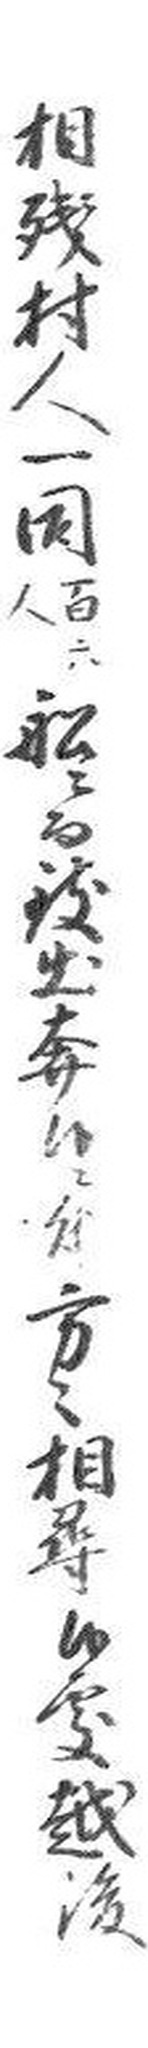相残村人一同百六人船ニ而致出奔候ニ付方々相尋候処越後
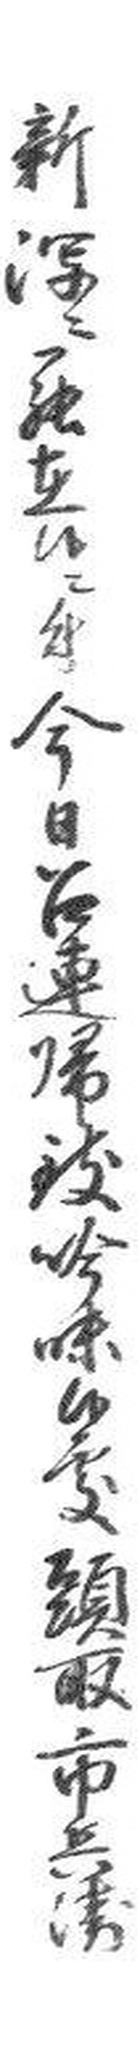新潟ニ罷在候ニ付今日召連帰致吟味候処頭取市兵衛
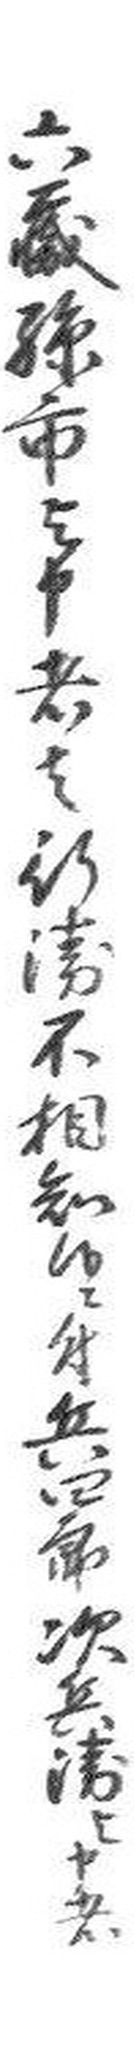六蔵孫市与申者行衛不相知候ニ付兵四郎次兵衛与申者
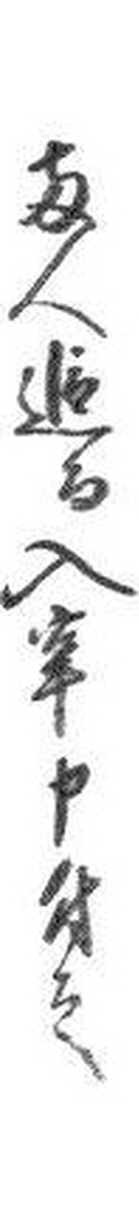両人追而入牢申付之
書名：家譜 四 忠昌公 従寛永七年到正保四年
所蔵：福井県文書館 Fukui Prefectural Archives
